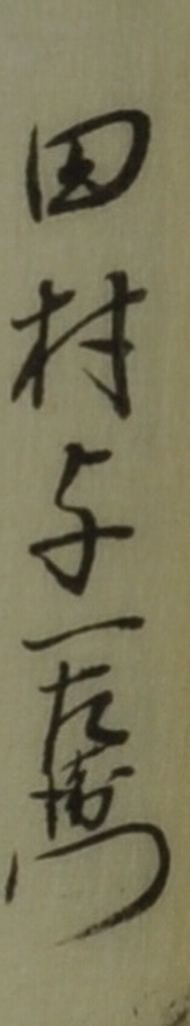田村与一左衛門
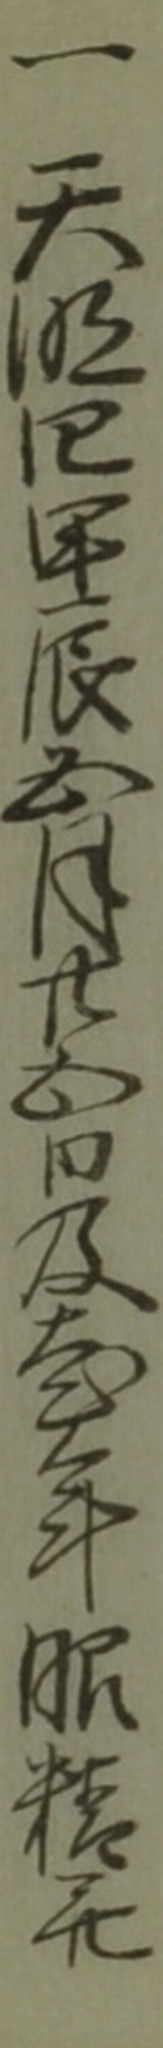一天明四甲辰五月廿五日及老年服精并
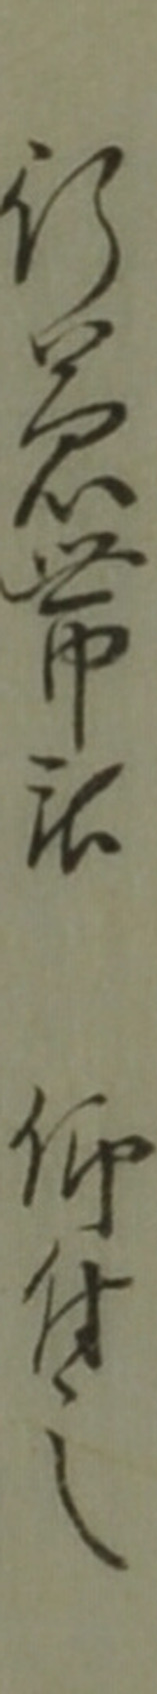行兼帯被仰付之
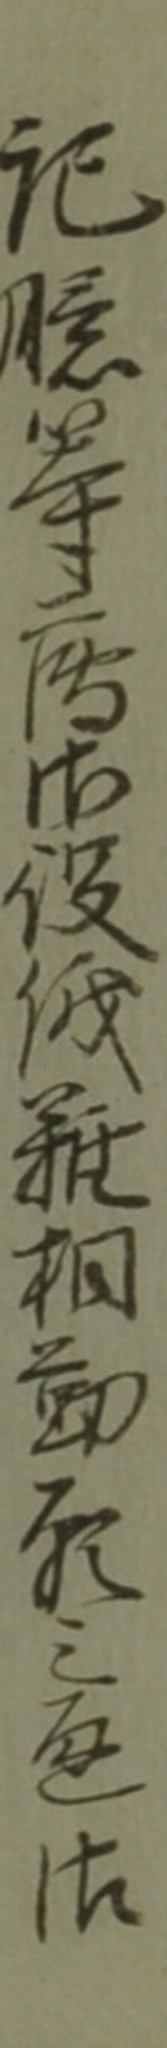記臆等◻︎御役儀難相勤願之通佐
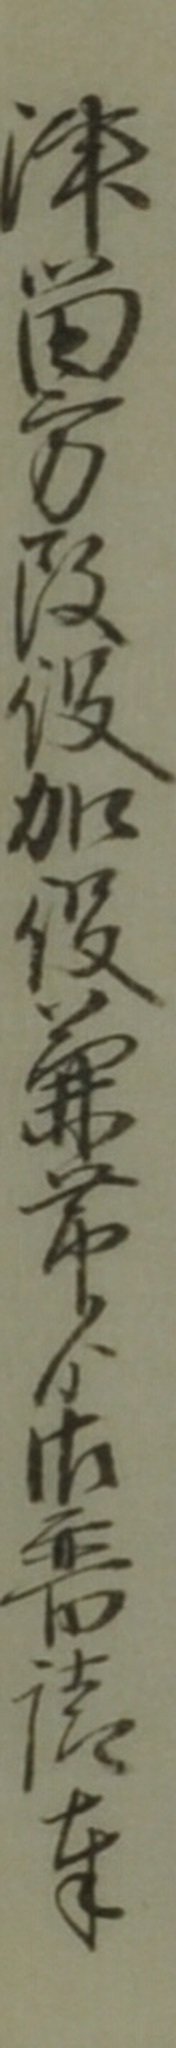津留方改役加役兼帯ゟ御普請奉
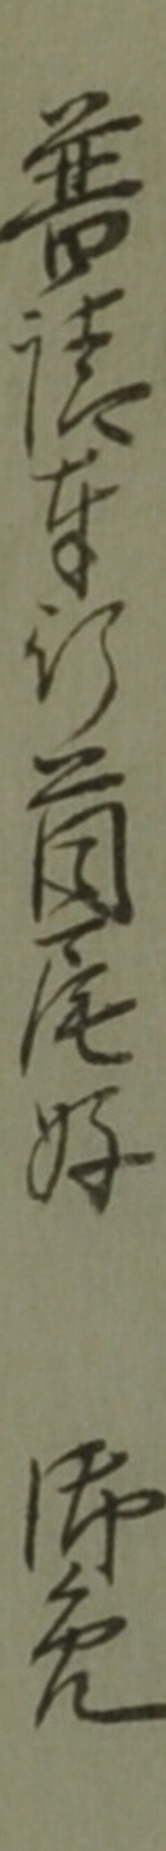普請奉行首尾好御免
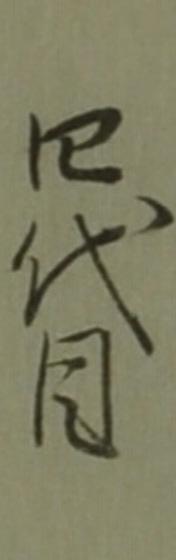四代目
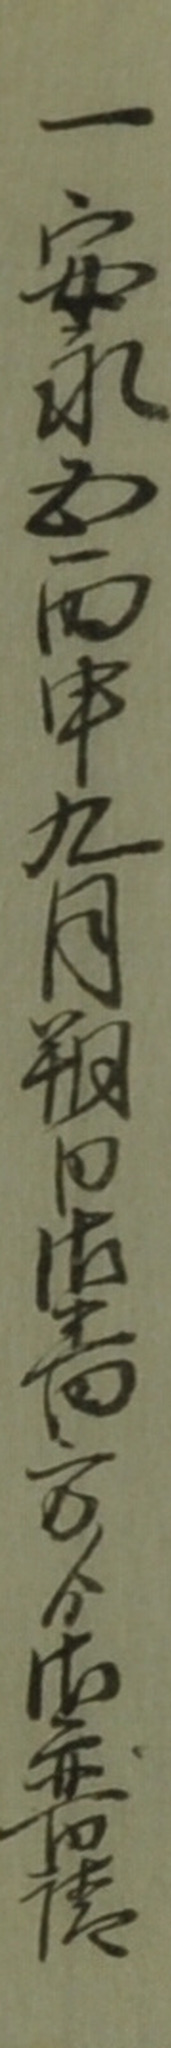一安永五丙申九月朔日御番方ゟ御普請
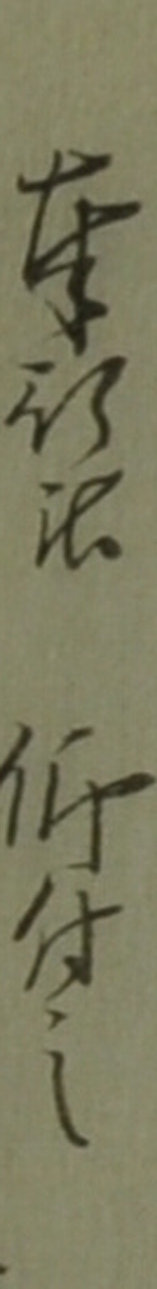奉行被仰付之
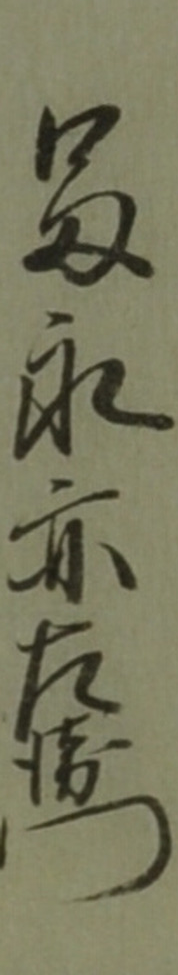冨永亦左衛門
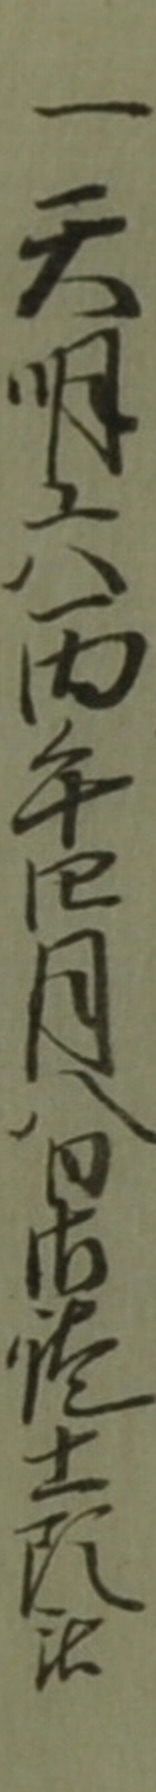一天明六丙午四月八日御徒士頭被
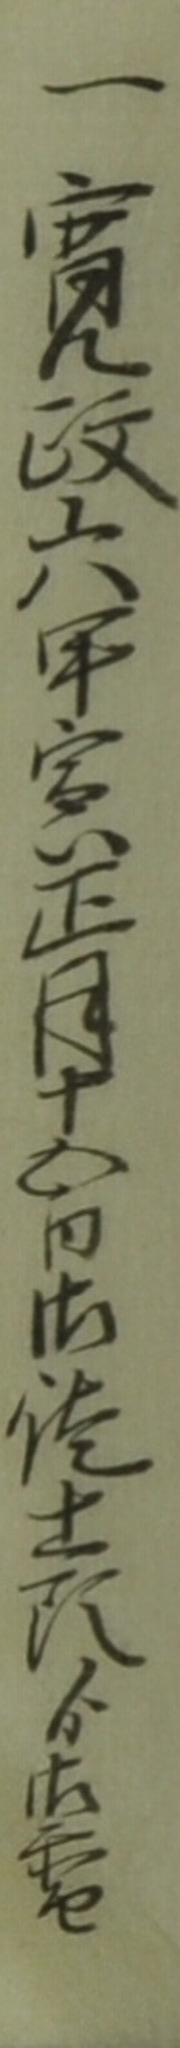一寛政六甲寅正月十五日御徒士頭ゟ御普
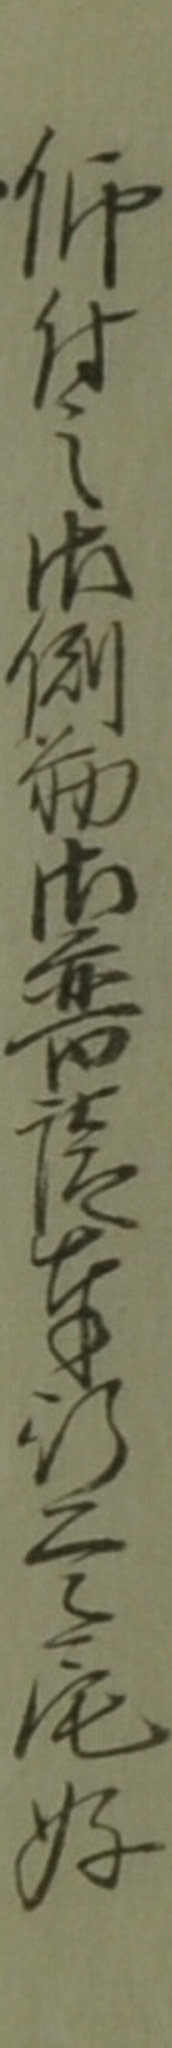仰付之御側勤御普請奉行首尾好

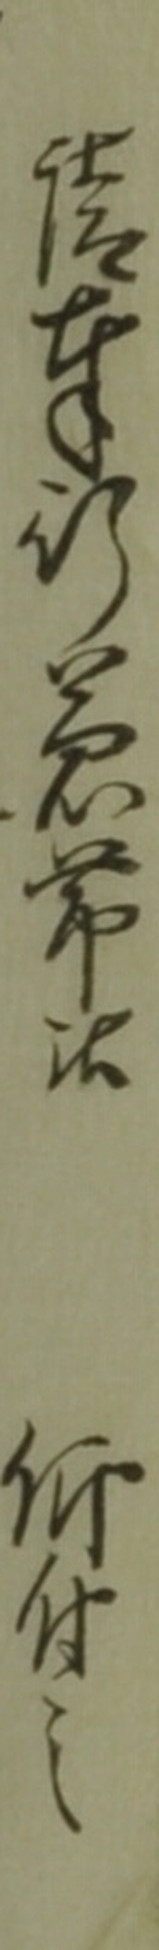請奉行兼帯被仰付之
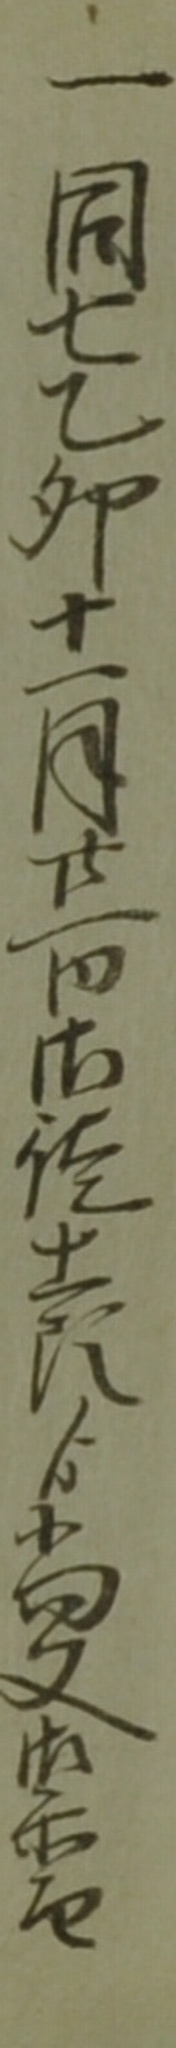一同七乙卯十一月廿一日御徒士頭ゟ尚又御普
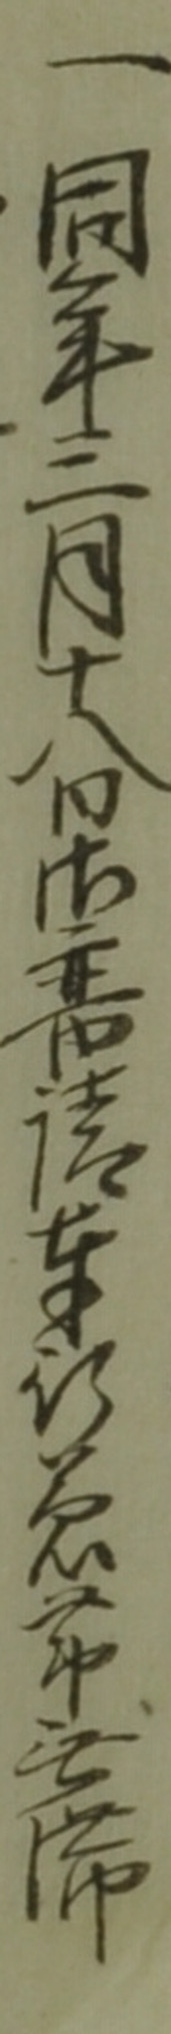一同年三月十八日御普請奉行兼帯無滞
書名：諸御役代々録（六）
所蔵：伊那市立高遠町図書館・合同会社AMANE
